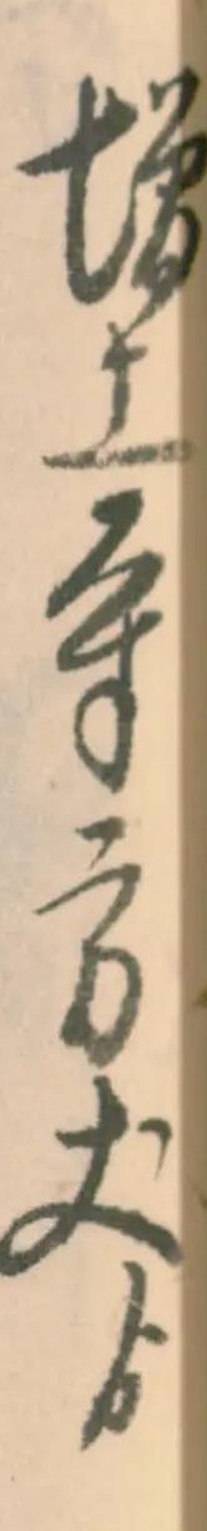増上寺方丈ゟ
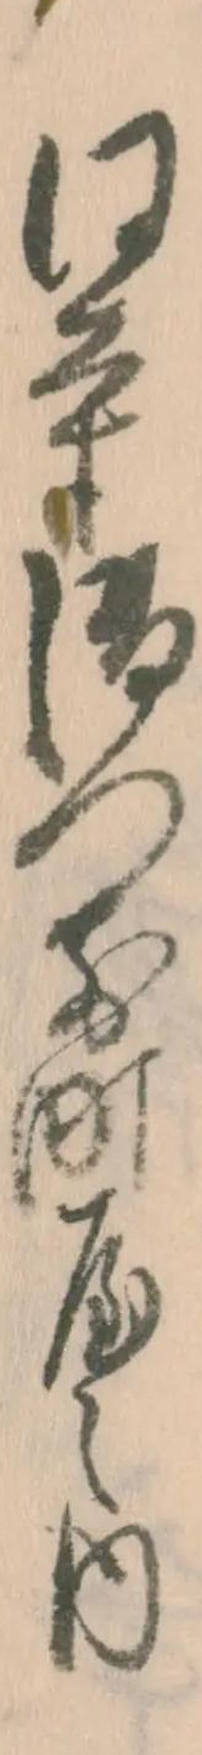同寺御門前町屋之内
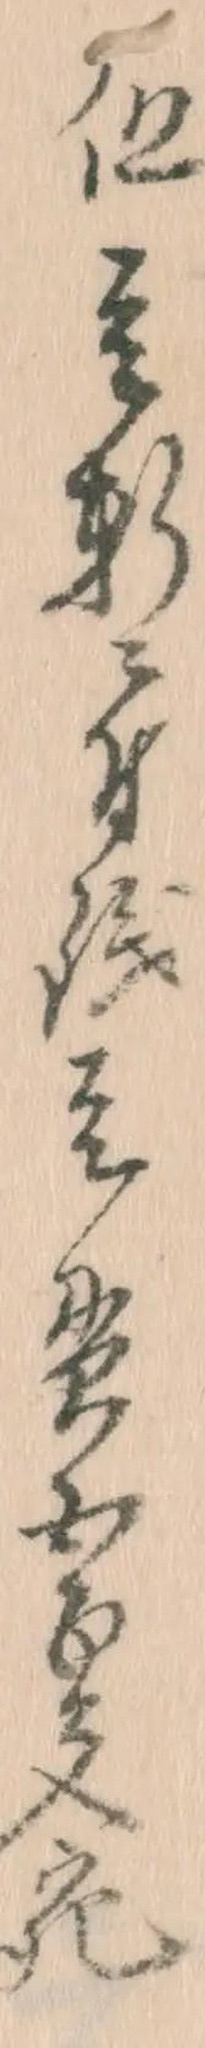但壱軒ニ付銭壱貫五百文宛

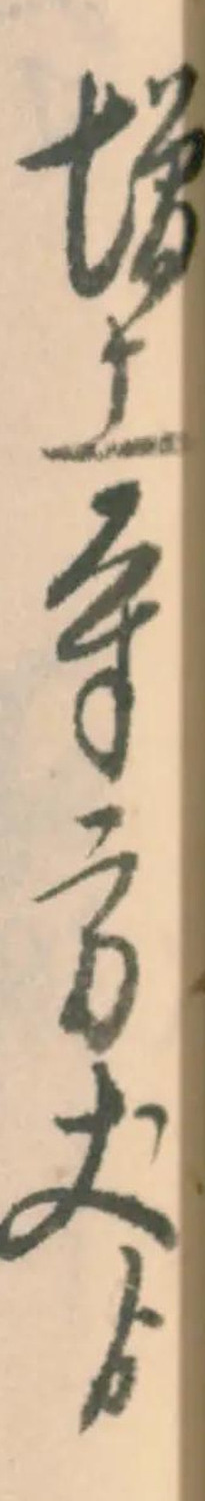増上寺方丈ゟ
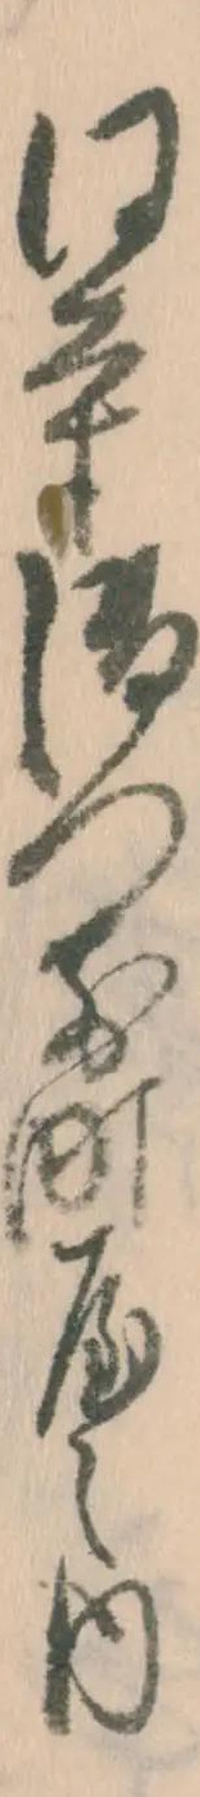同寺御門前町屋之内
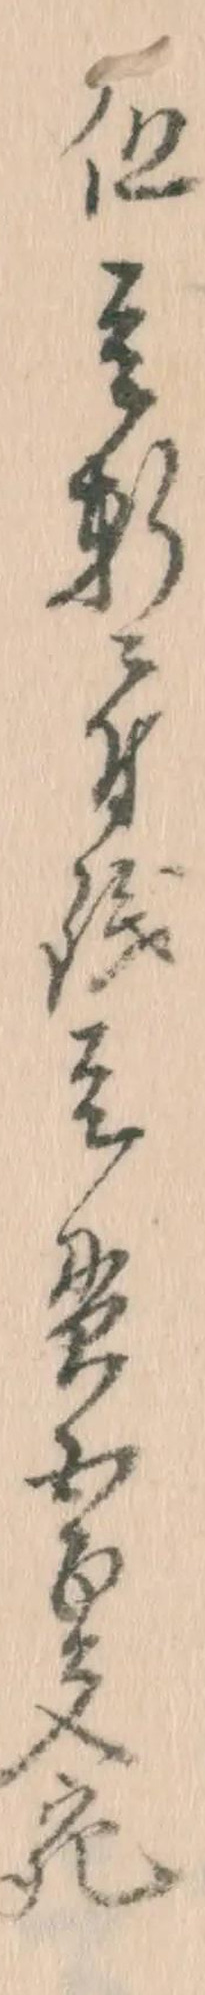但壱軒ニ付銭壱貫五百文宛

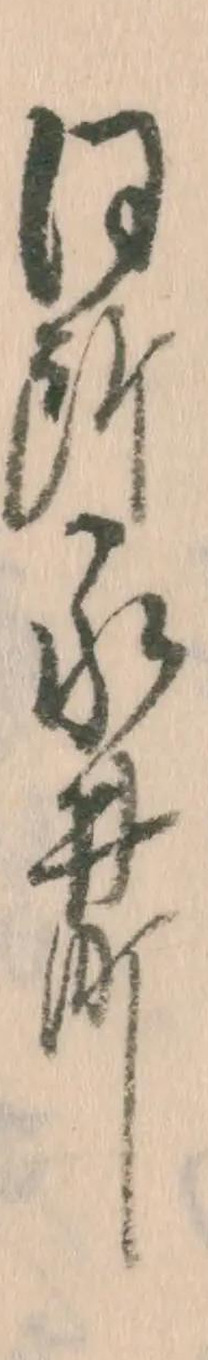同所永井町
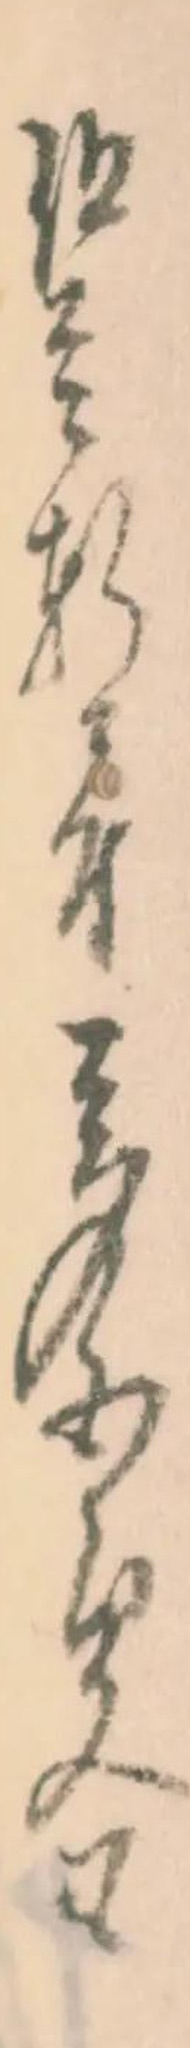但壱軒ニ付壱貫五百文ツヽ
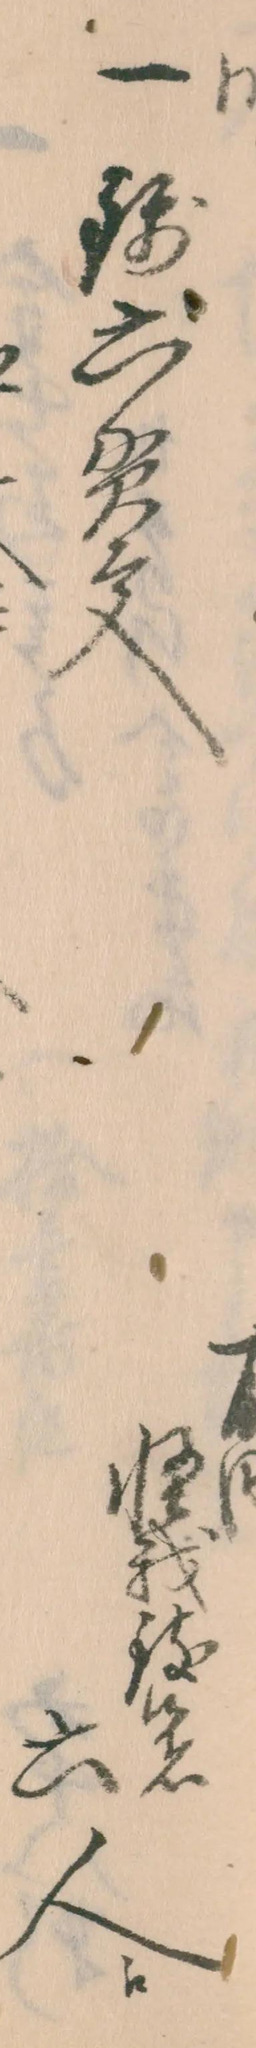一銭六貫文怪我致候者
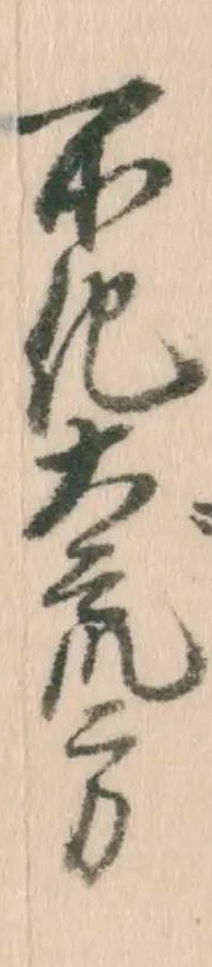所化大衆ゟ
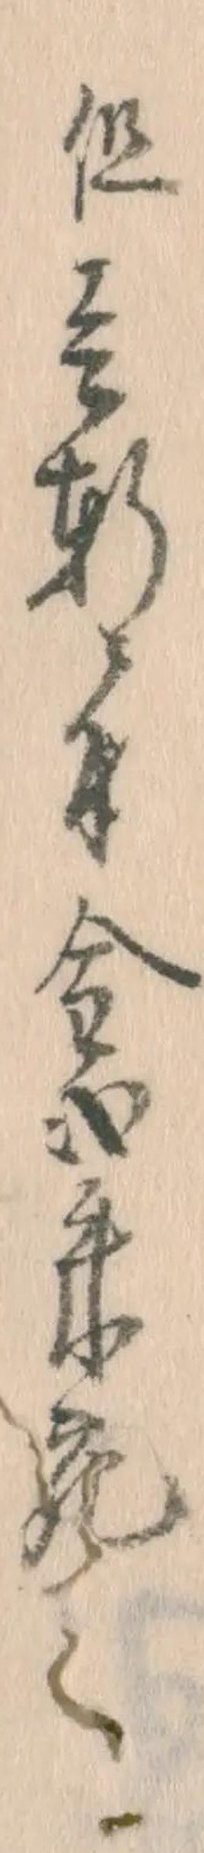但壱軒ニ付金弐朱宛

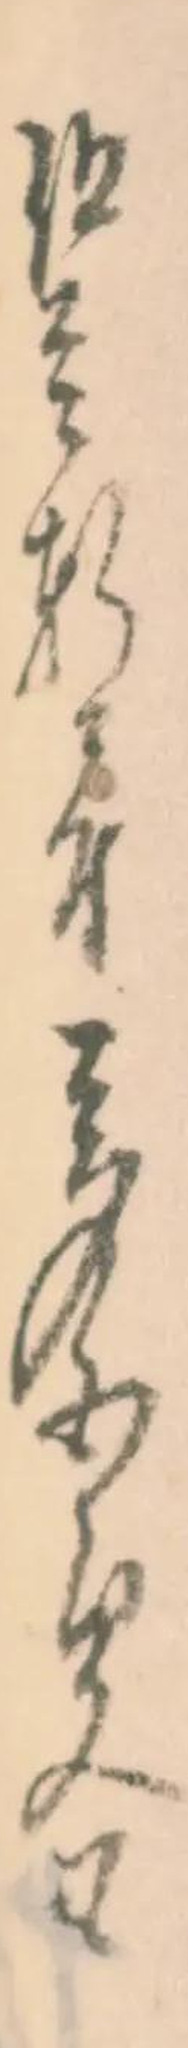但壱人ニ付壱貫文ツヽ弐人

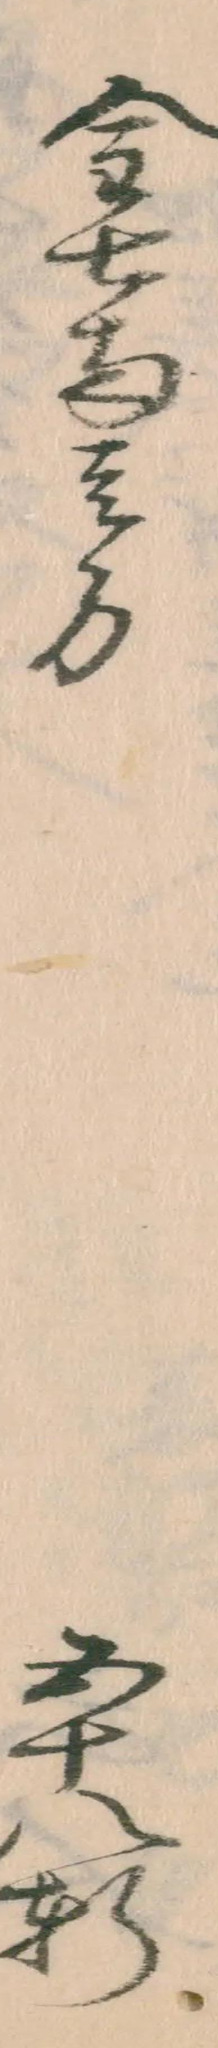一金七両壱分表裏平均
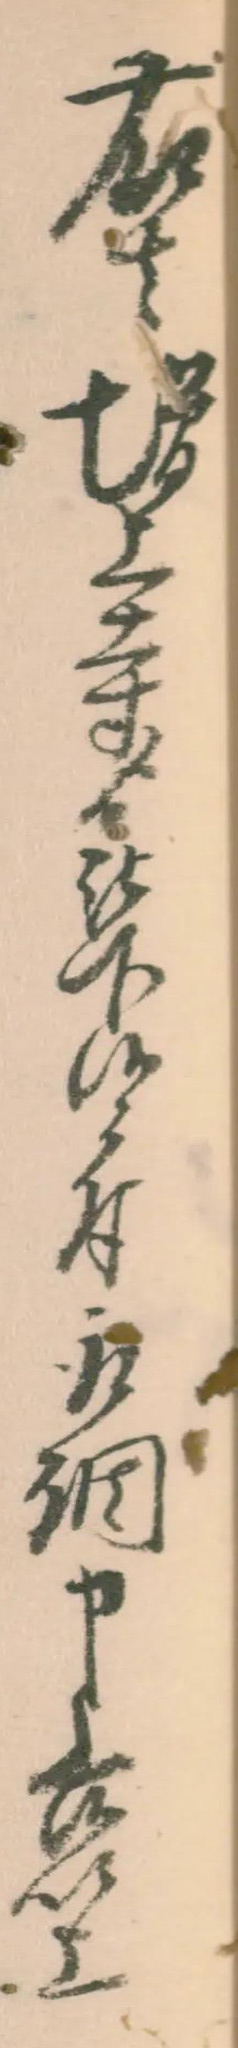右は増上寺ゟ被下候ニ付取調申上候以上
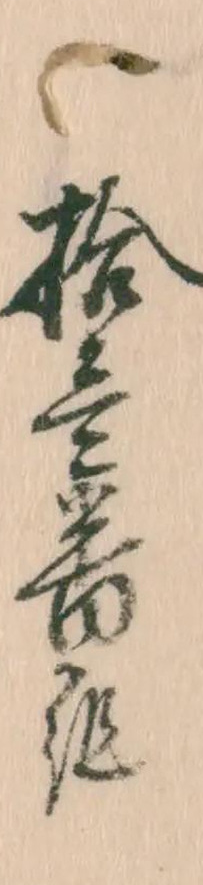拾壱番組
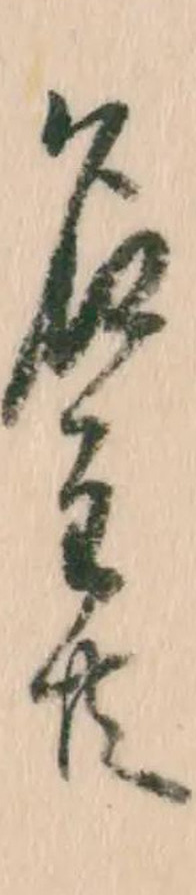名主共
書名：武家方并寺院等ニテ施差出候一件
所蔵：国立国会図書館 National Diet Library, JAPAN
